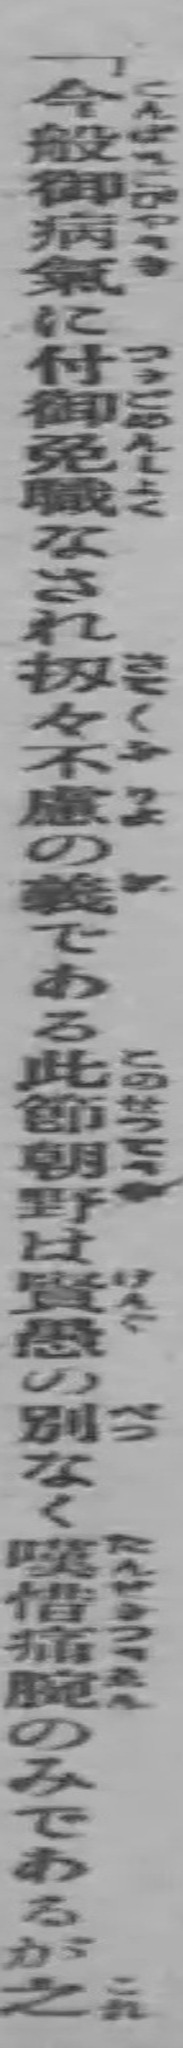述斉の書翰「今般御病気に付御免職なされ扨々不慮の義である此節朝野は賢愚の別なく嘆惜痛腕のみであるが之
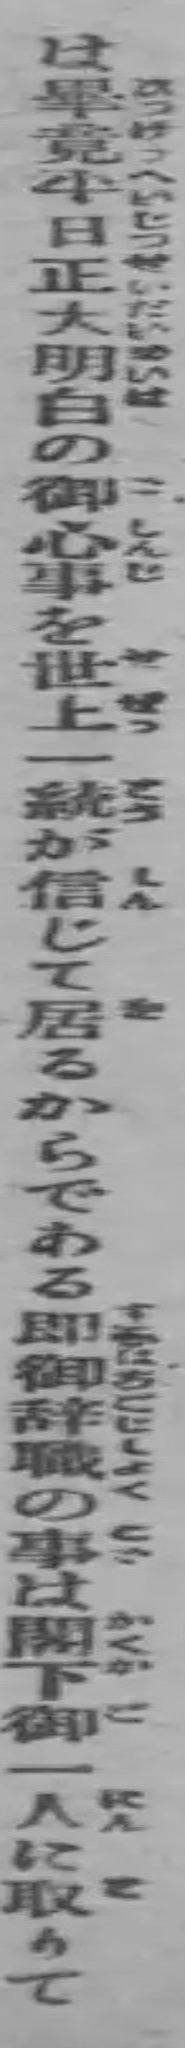は畢竟平日正大明白の御心事を世上一統が信じて居るからである即御辞職の事は閣下御一人に取りて
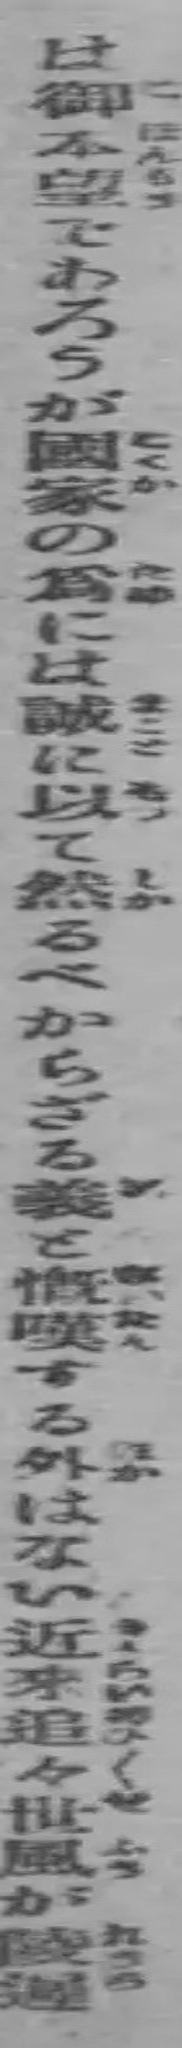は御本望であろうが国家の為には誠に以て然るべからざる義と概嘆する外はない近来追々世風が陵遅

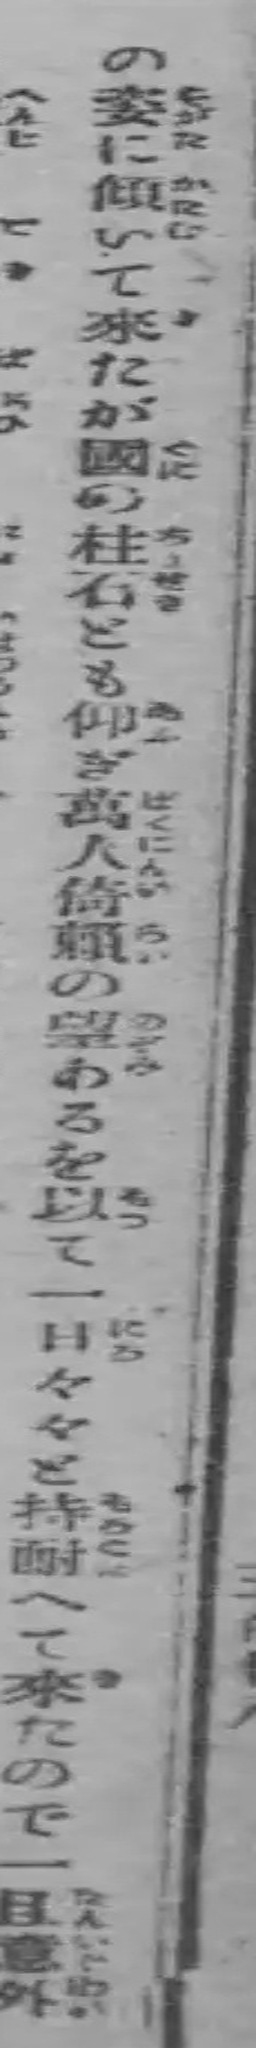の姿に傾いて来たが国の柱石とも仰ぎ万人倚頼の望あるを以て一日々々と持耐へて来たので一且意外
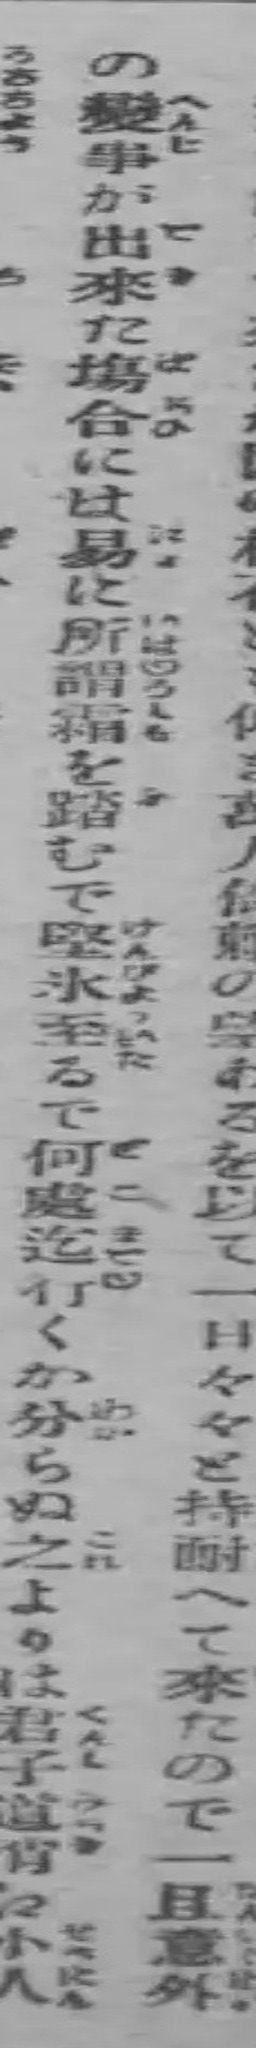の変事が出来た場合には易に所謂霜を踏むで堅氷至るで何処迄行くか分らぬ之よりは君子道消え小人
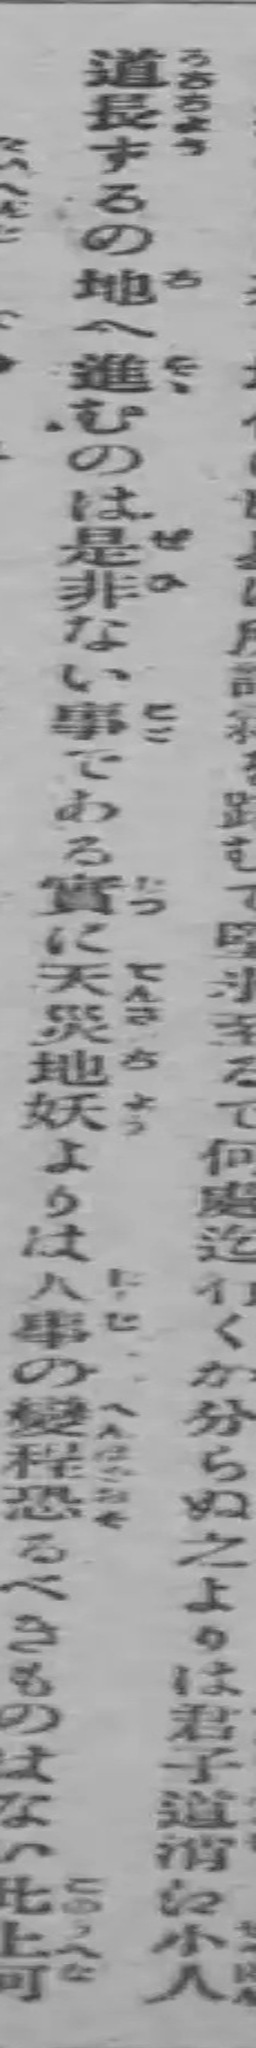道長ずるの地へ進むのは是非ない事である実に天災地妖よりは人事の変程恐るべきものはない此上何
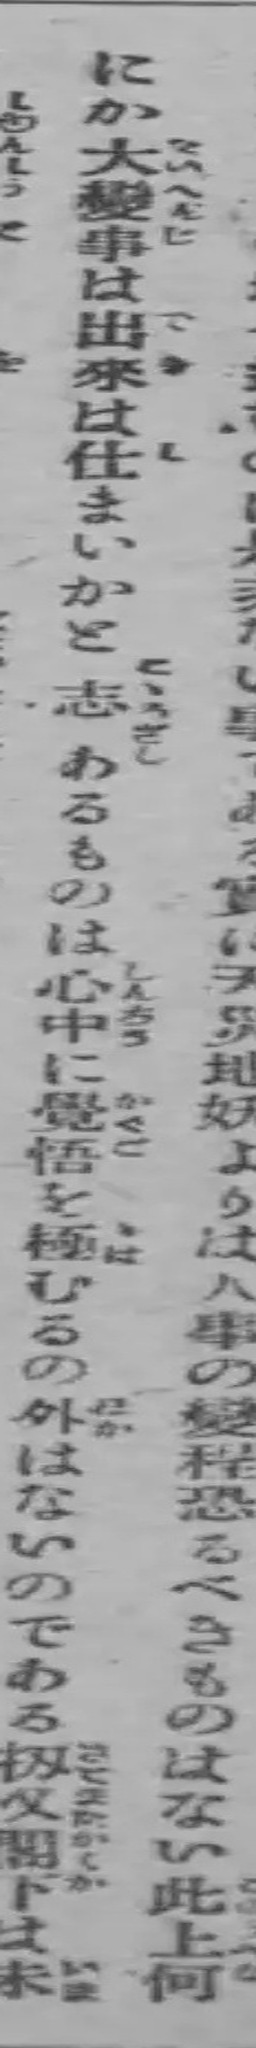にか大変事は出来は仕まいかと志あるものは心中に覚悟を極むるの外はないのである扨又閣下は未
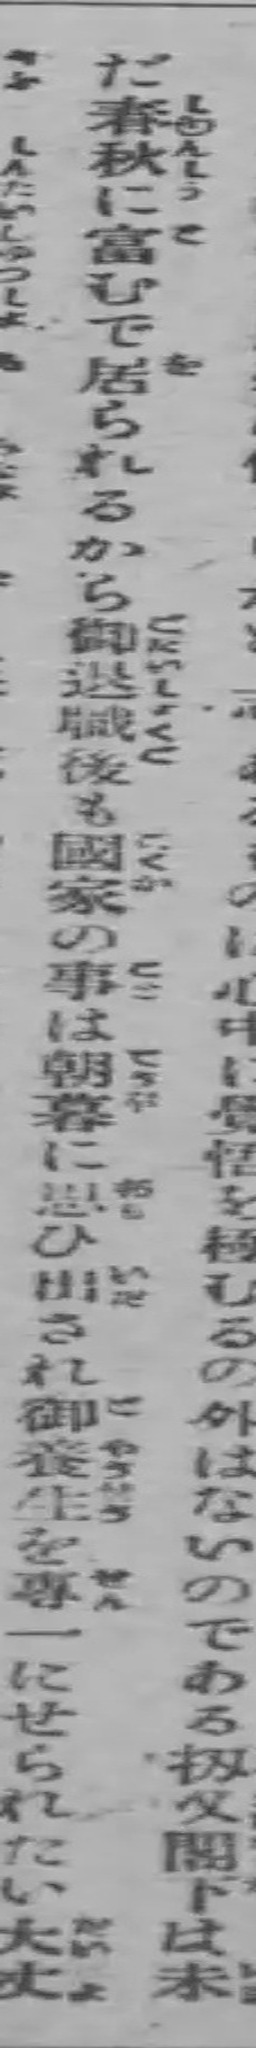だ春秋に富むで居られるから御退職後も国家の事は朝暮に思ひ出され御養生を専一にせられたい大丈
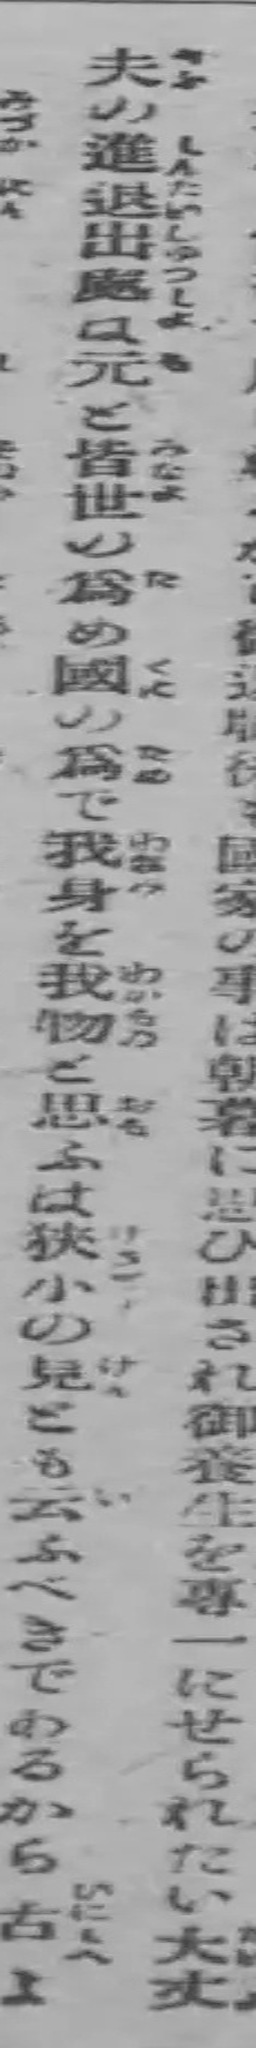夫の進退出処は元と皆世の為め国の為で我身を我物と思ふは狭小の見とも云ふべきであるから古よ
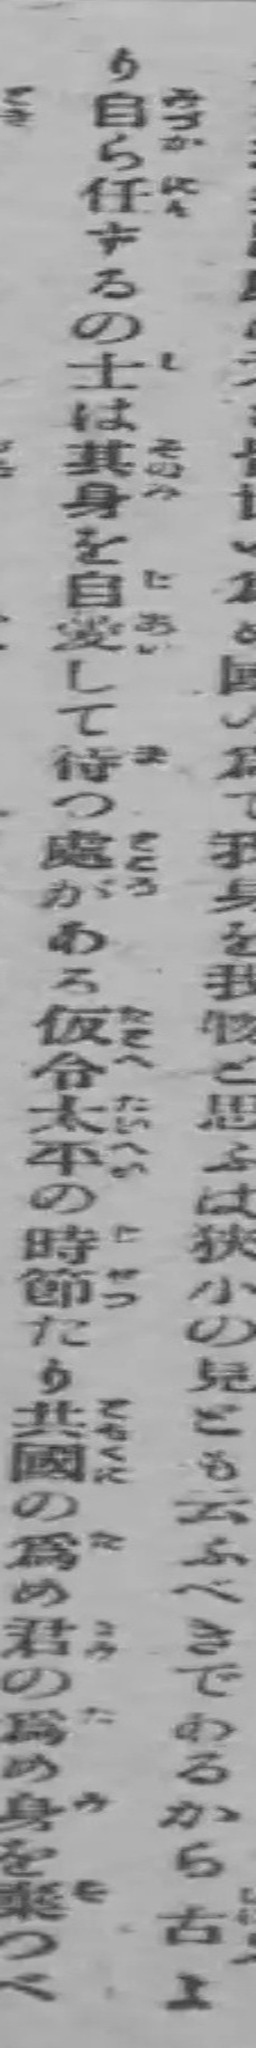り自ら任ずるの士は其身を自愛して待つ処がある仮令太平の時節たり共国の為め君の為め身を棄つべ
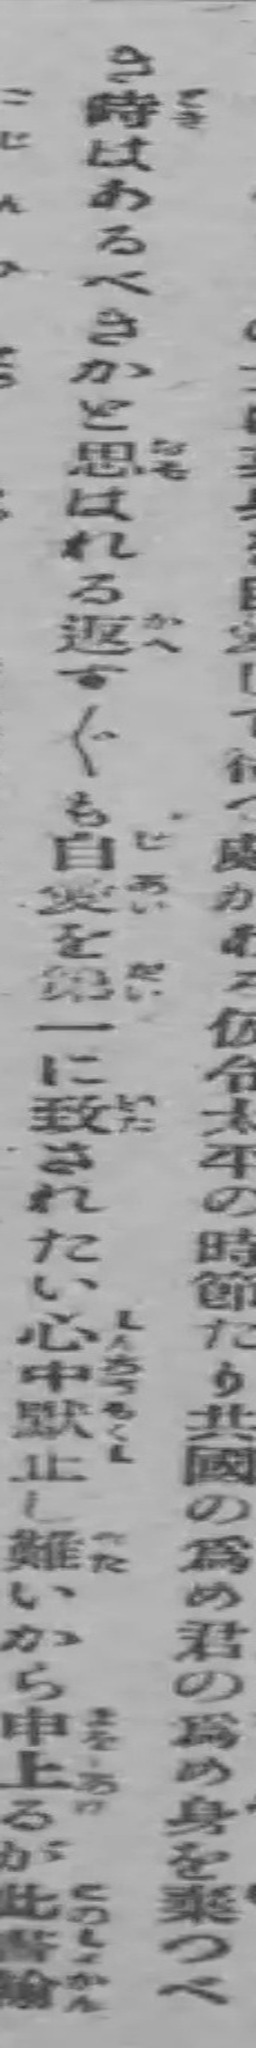き時はあるべきかと思はれる返す〴〵も自愛を第一に致されたい心中黙止し難いから申上るが此書翰
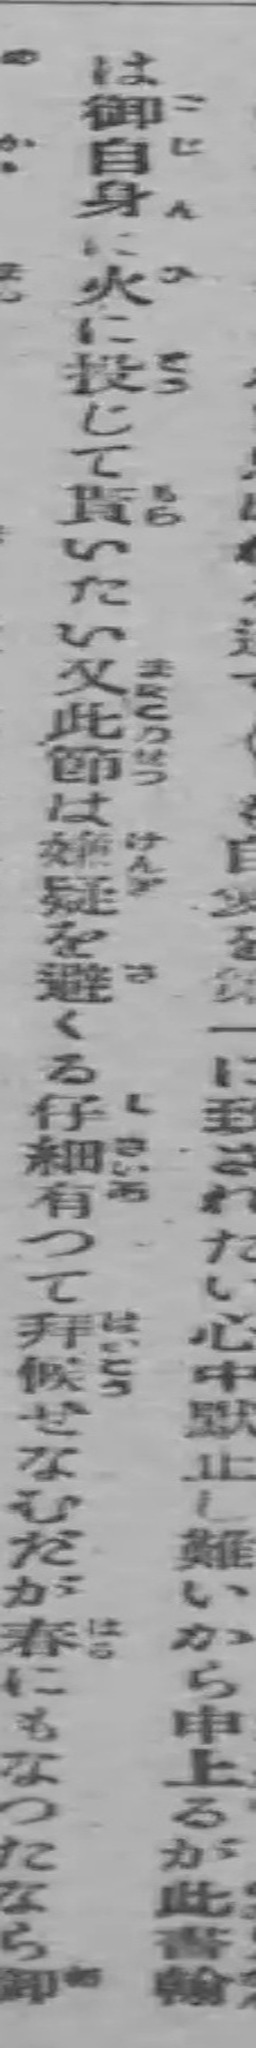は御自身に火に投じて貰いたい又此節嫌疑を避くる仔細有つて拝候せなむだが春にもなつたなら御
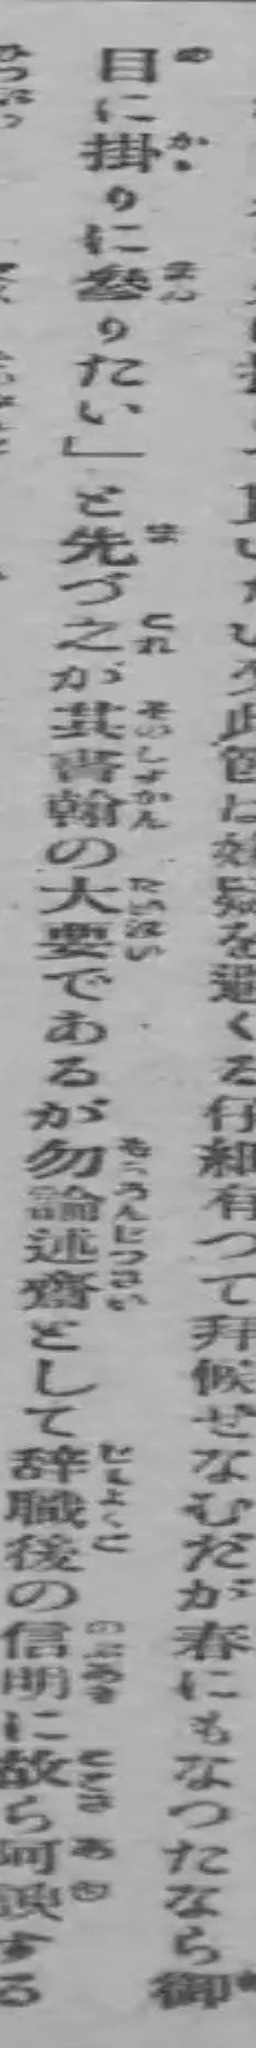目に掛りに参りたい」と先づ之が其書翰の大要であるが勿論述斉として辞職後の信明に故ら阿諛する
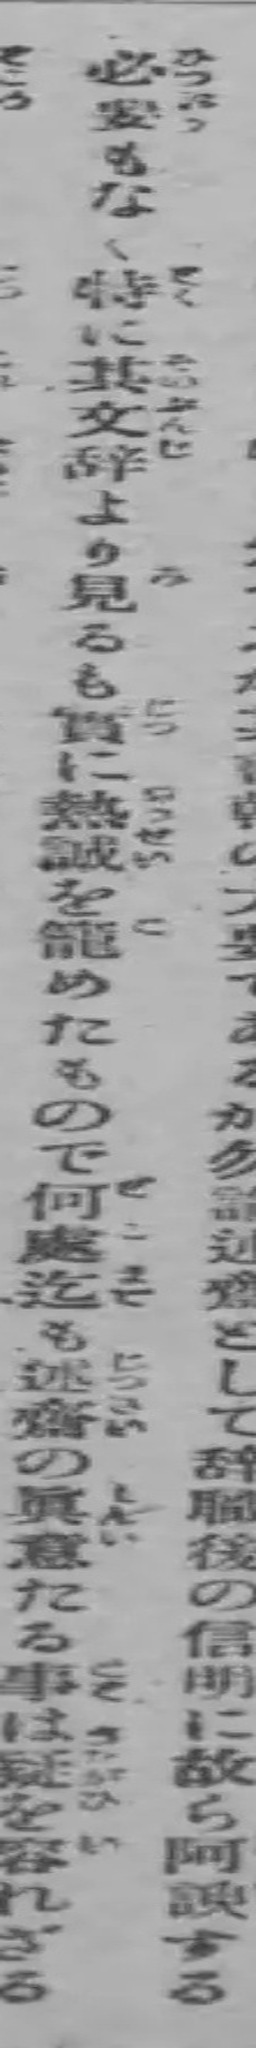必要もなく特に其文辞より見るも実に熱誠を籠めたもので何処迄も述斉の真意たる事は疑を容れざる
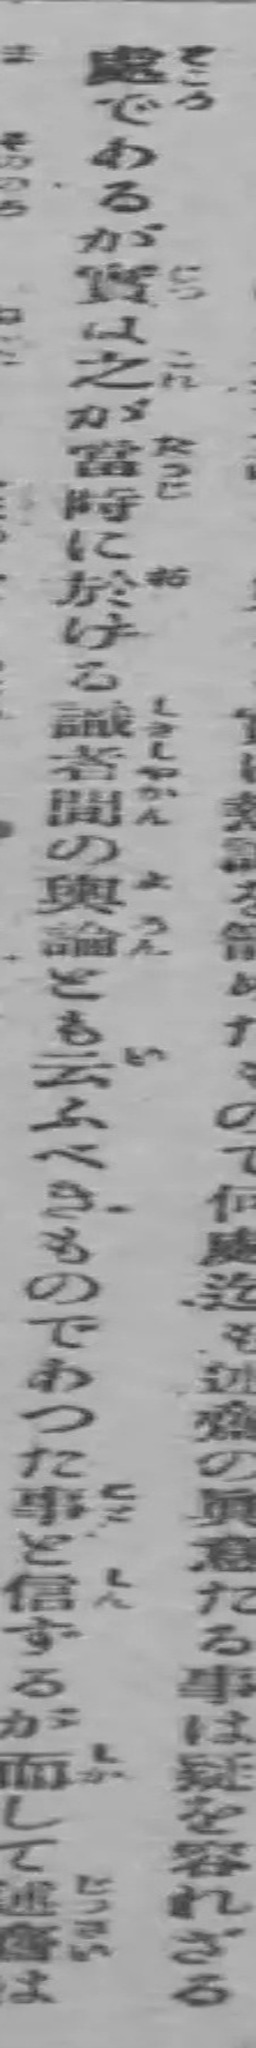処であるが実は之が当時に於ける識者間の与論とも云ふべきものであつた事と信ずるが而して述斉は
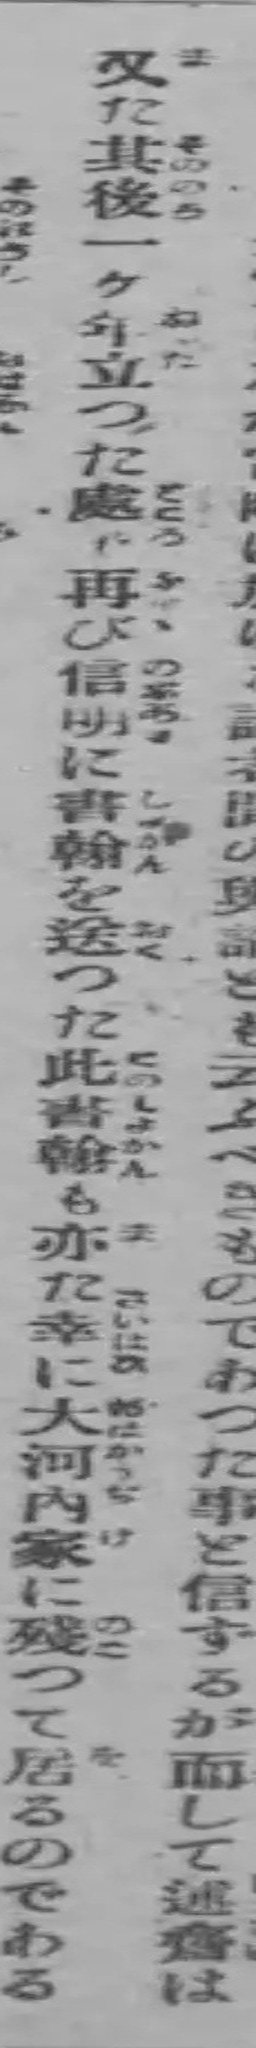又た其後一ケ年立つた処で再び信明に書翰を送つた此書翰も亦た幸に大河内家に残つて居るのである
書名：豊橋市史談
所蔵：国立国会図書館 National Diet Library, JAPAN
